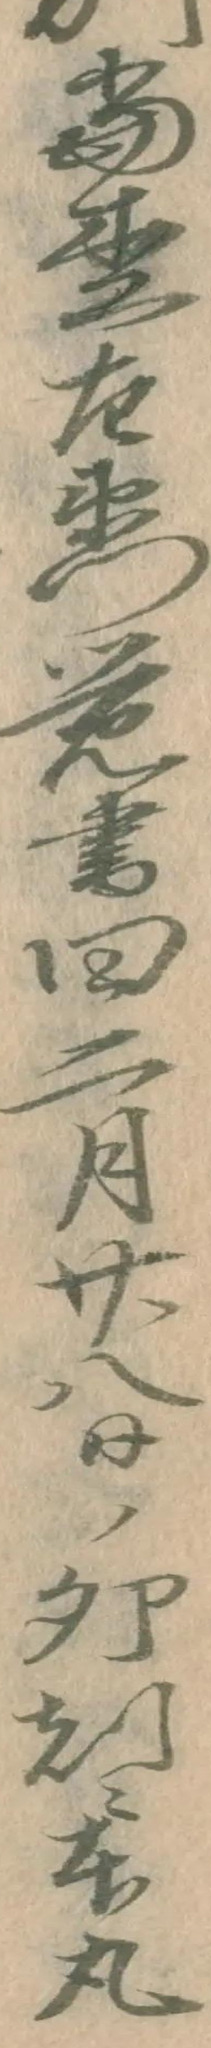別当杢左衛門覚書曰二月廿八日之夘刻に本丸
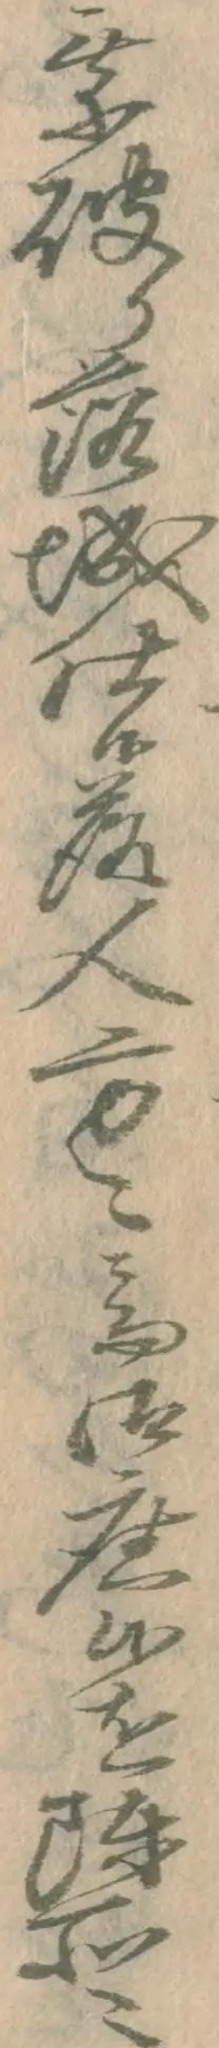乗破り落城仕候落人方々に而御座候を陳所に

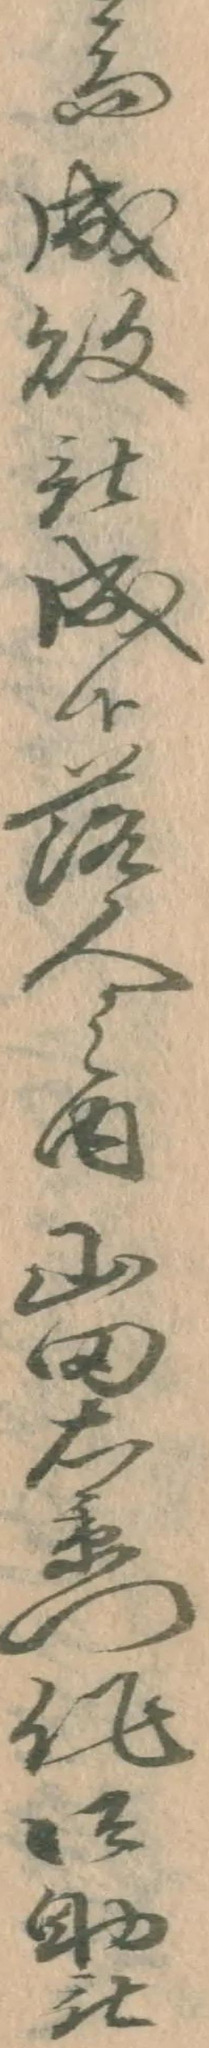に而成敗被成候落人之内山田右衛門作御助被
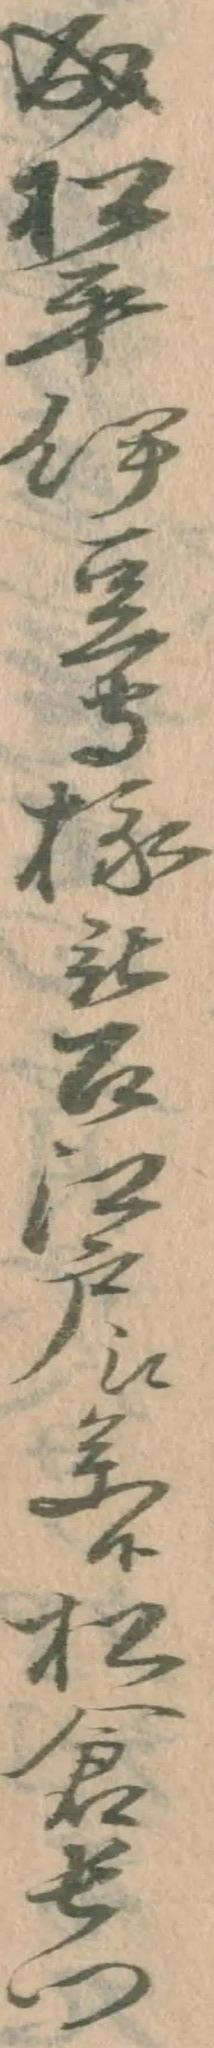成松平伊豆守様被召江戸江参候松倉長門
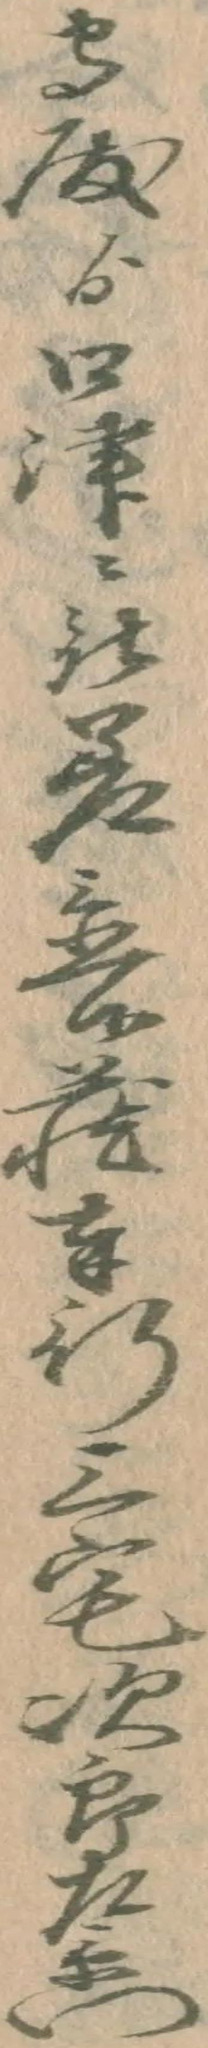守殿ゟ口津に被差置候蔵奉行三宅次郎左衛門
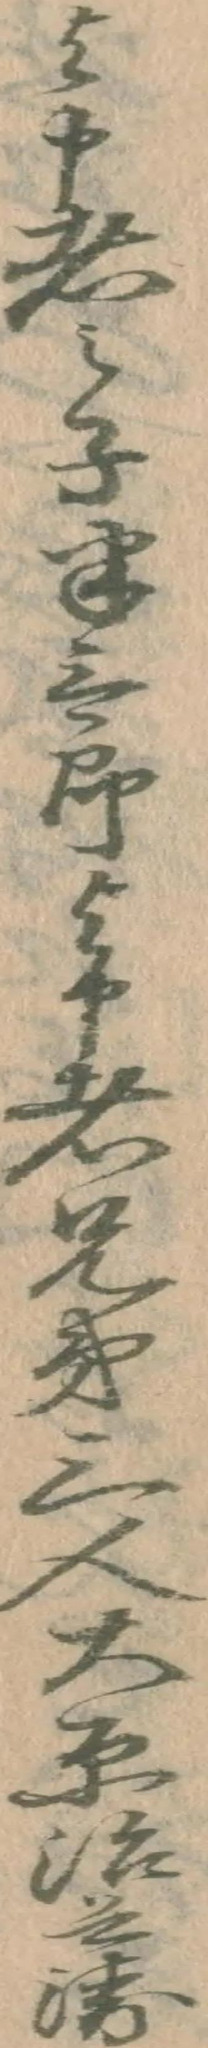与申者之子半三郎与申者兄弟三人大原治兵衛
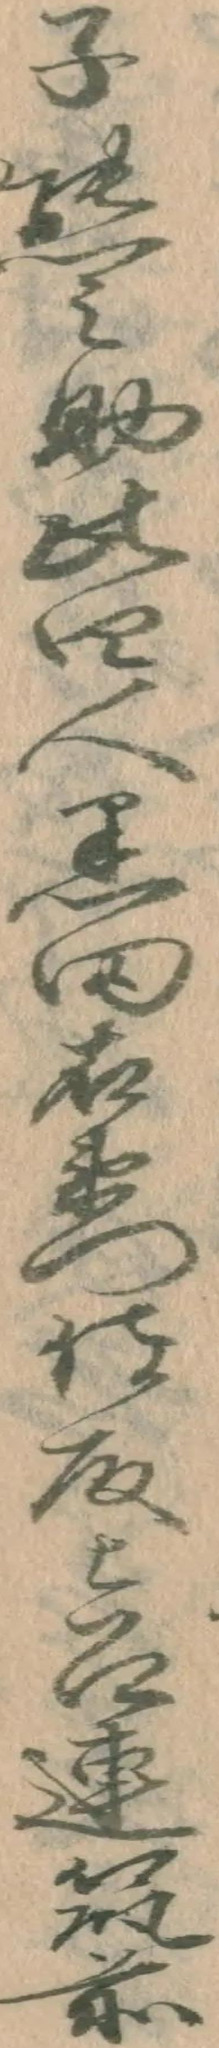子熊之助此四人黒田右衛門佐殿被召連筑前
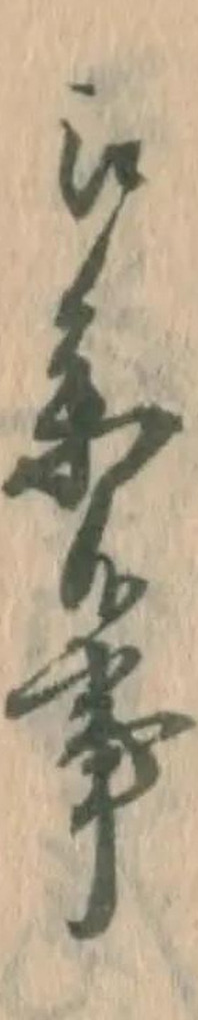江参候事
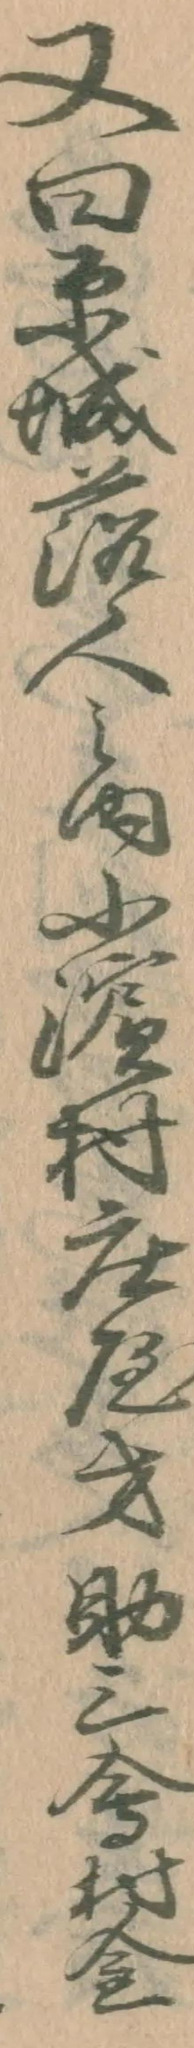又曰原城落人之内小浜村庄屋才助三会村金
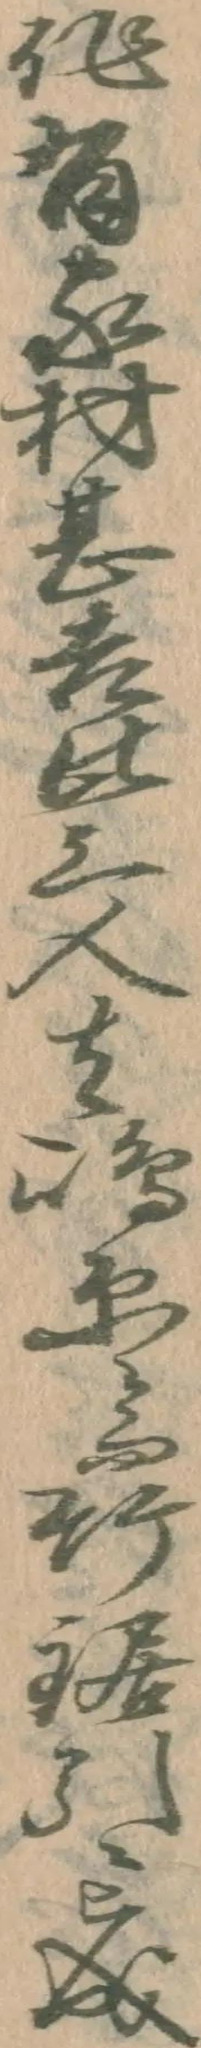作有家村甚吉此三人者島原に而竹鋸引に被成
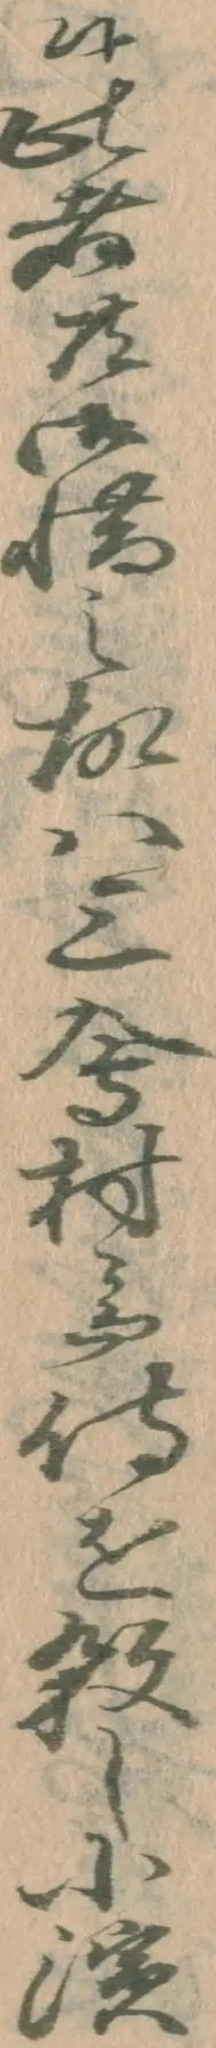候此者共御惜之故は三会村に而侍を殺し小浜
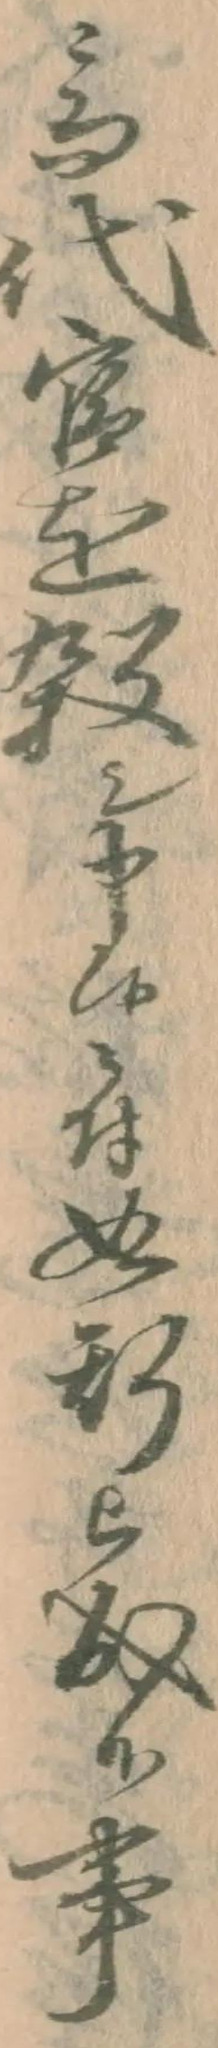に而代官を殺し申候に付如斯被成候事
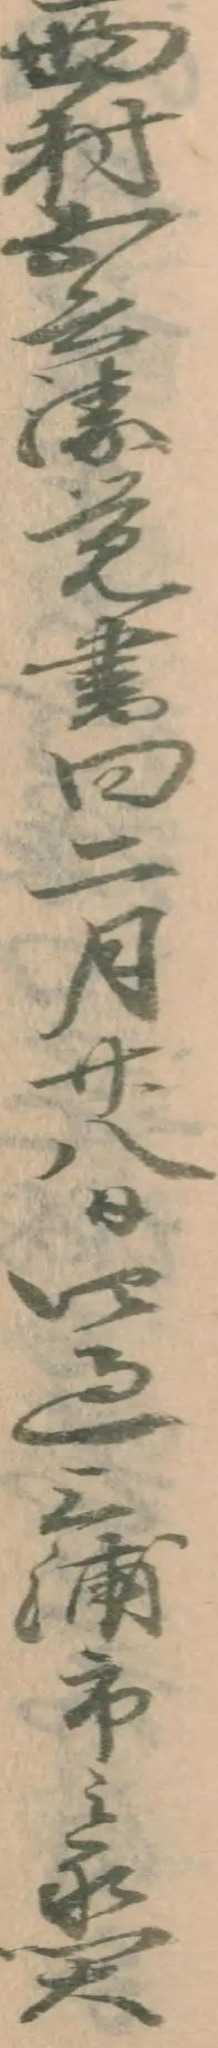西村五兵衛覚書曰二月廿八日四過三浦市之丞大
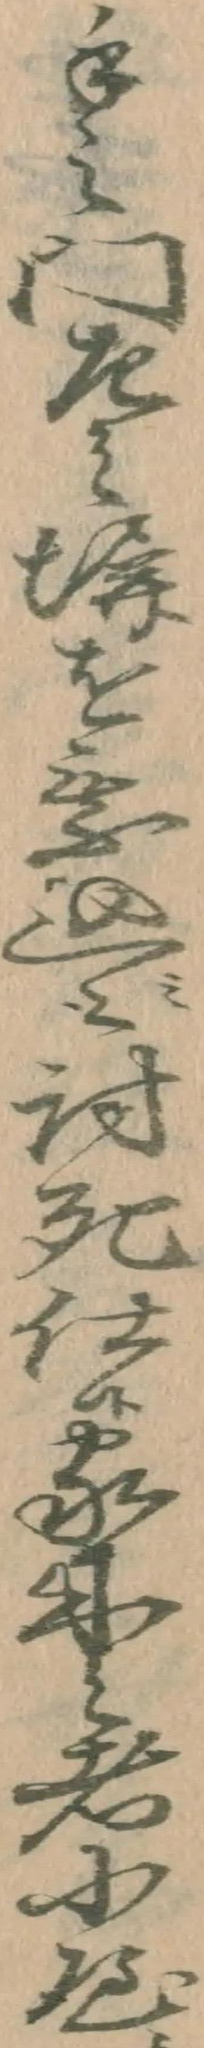手之門左之塀を乗込み討死仕候家来之者小屋に
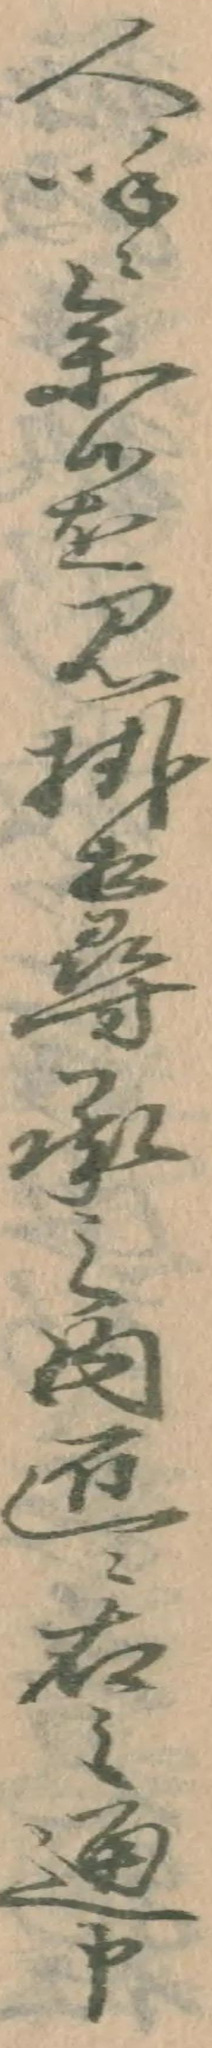人呼に参候を見掛相尋承之内匠に右之通申
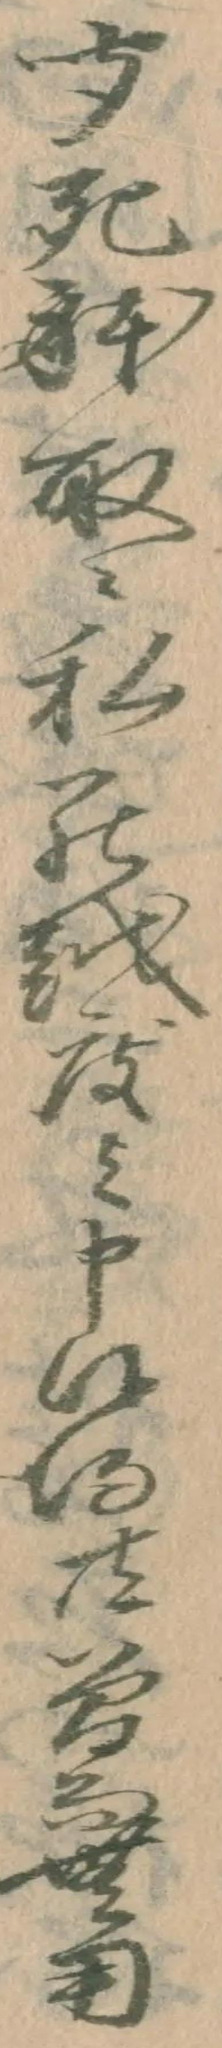聞死躰取に私罷越度与申候得共曽而無用
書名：切支丹御退治記 49巻. [8]
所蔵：国立国会図書館 National Diet Library, JAPAN
